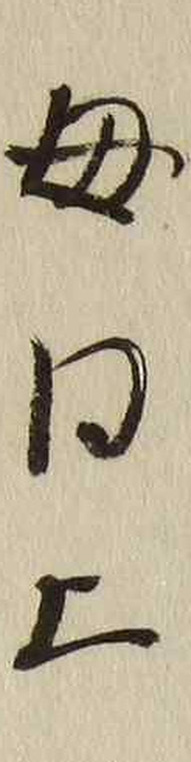母同上
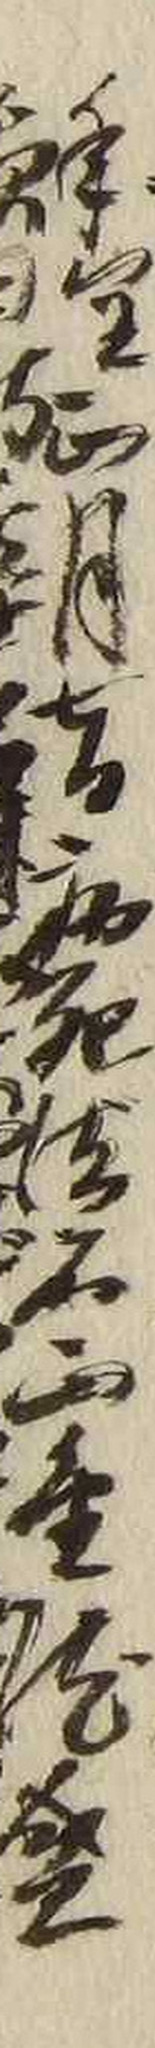年閏正月七日病死法名正金院盛
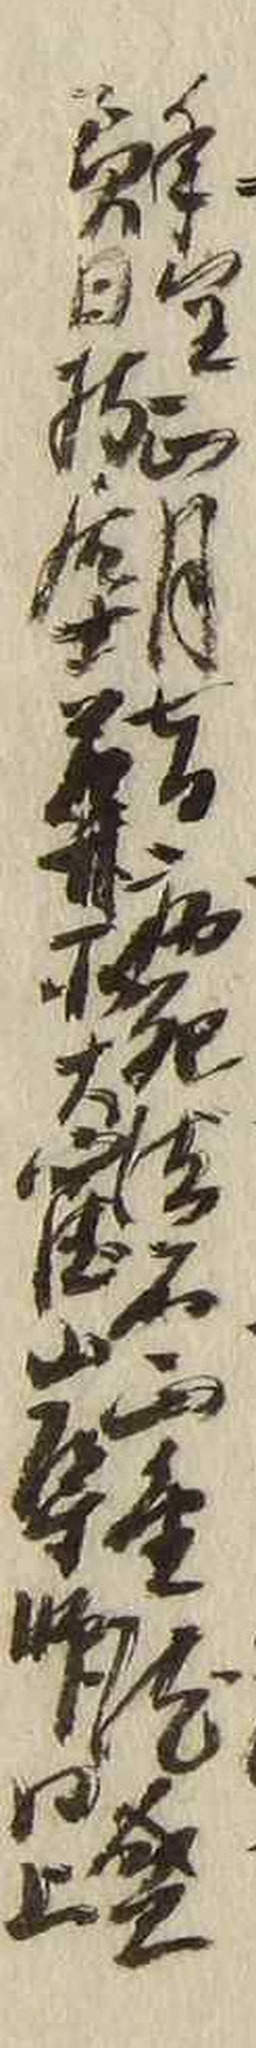美日持居士葬所大寵山導師同上

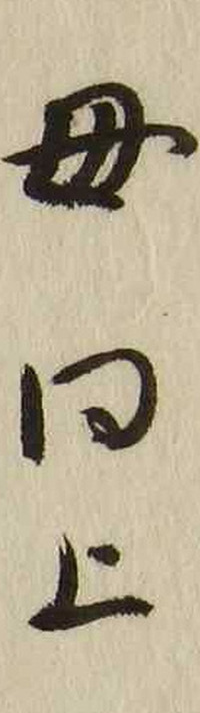母同上
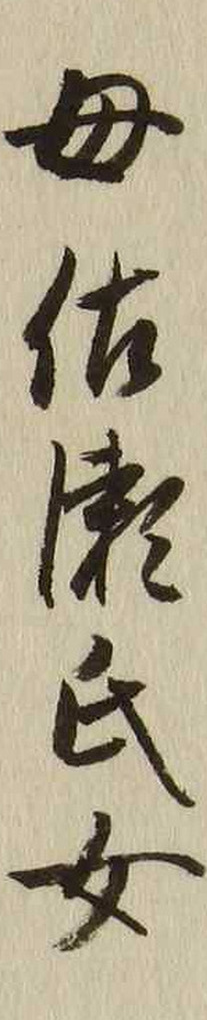母佐瀬氏女
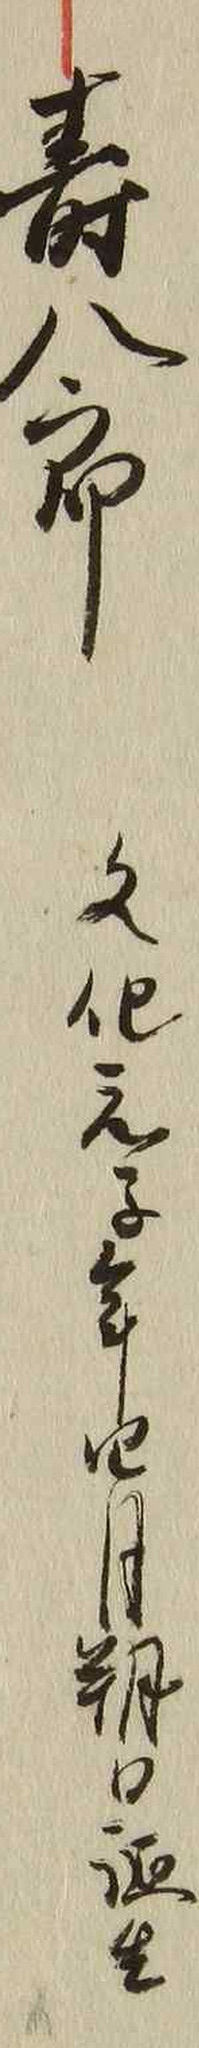寿八郎文化元子年四月朔日誕生
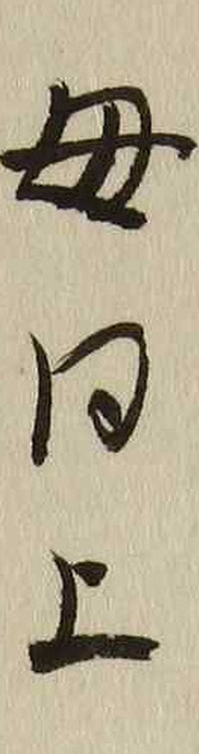母同上
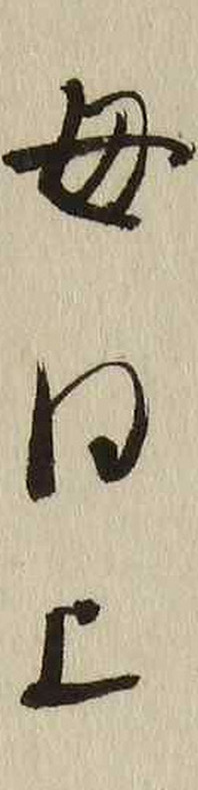母同上

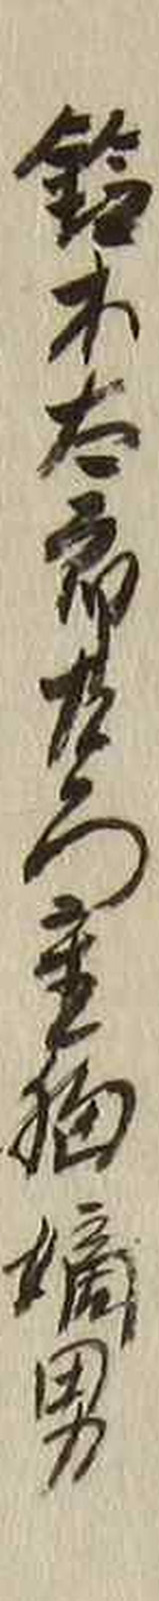鈴木太郎左衛門重胸嫡男
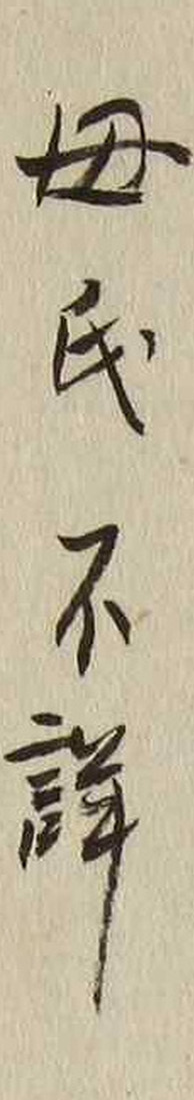母氏不詳
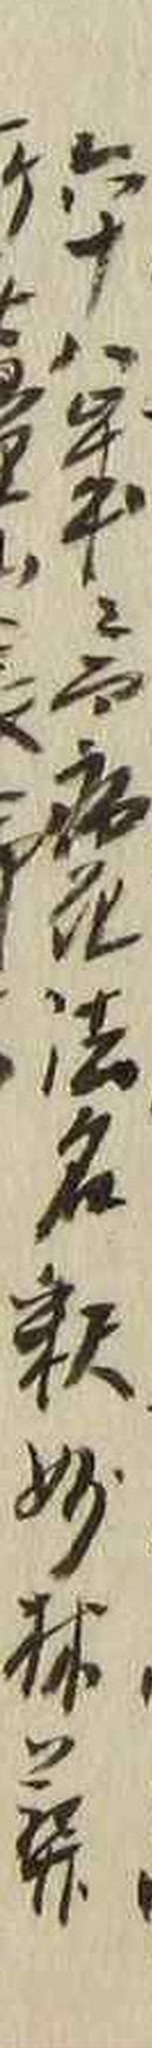六十八歳に而病死法名釈妙林葬
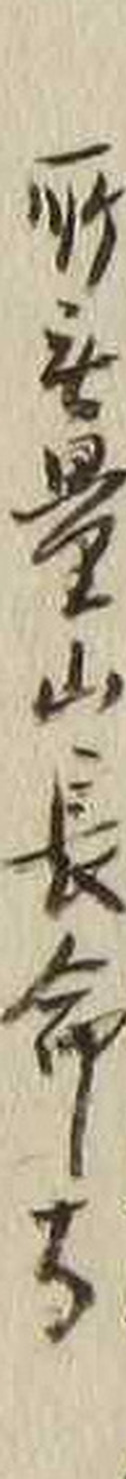所無量山長命寺
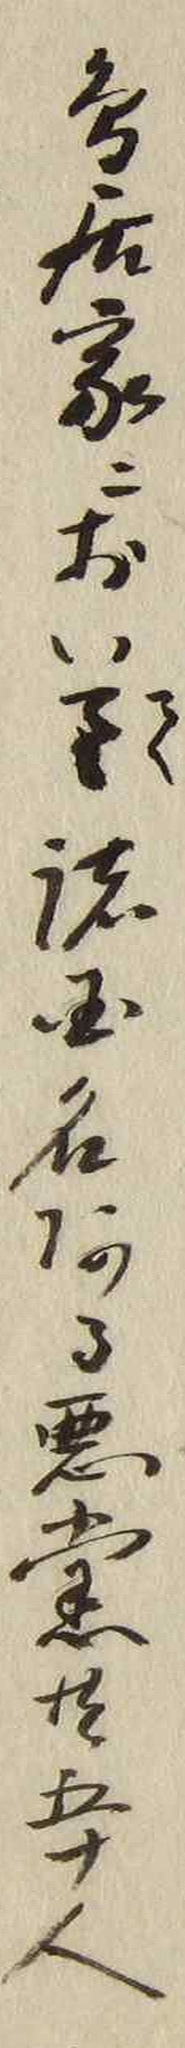鳥居家におゐて諸国名ある悪党共五十人
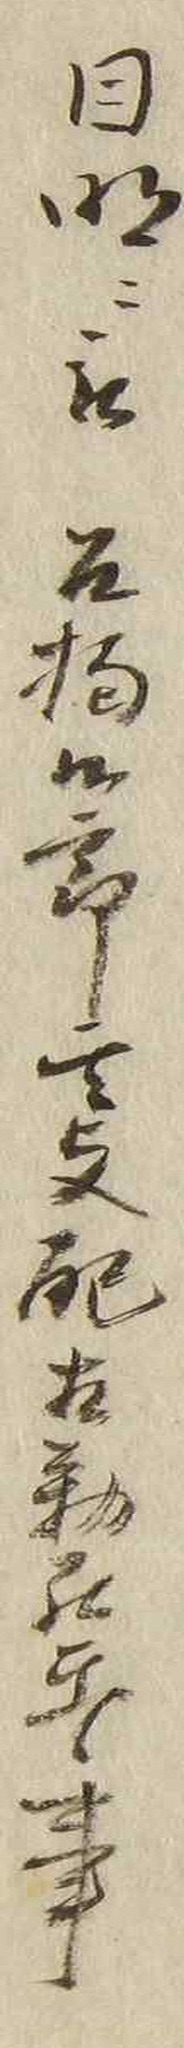目明に被召抱候節其支配相勤罷在候事

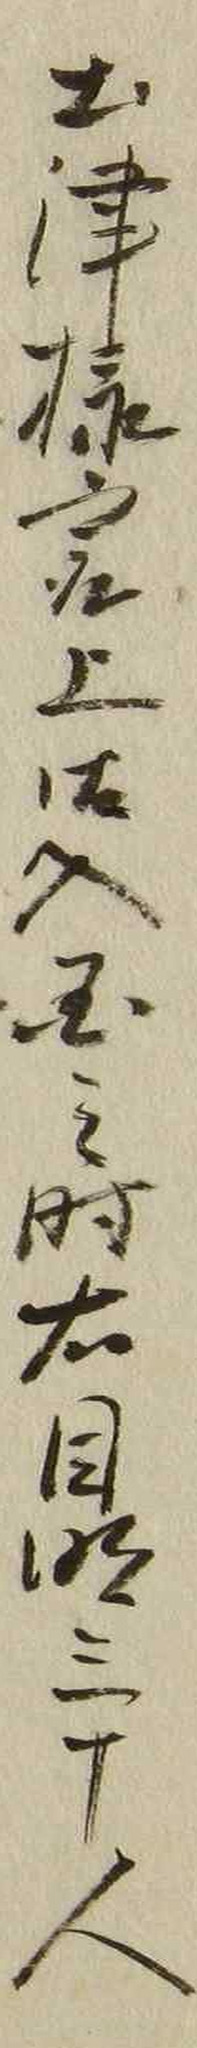土津様最上御入国之時右目明三十人
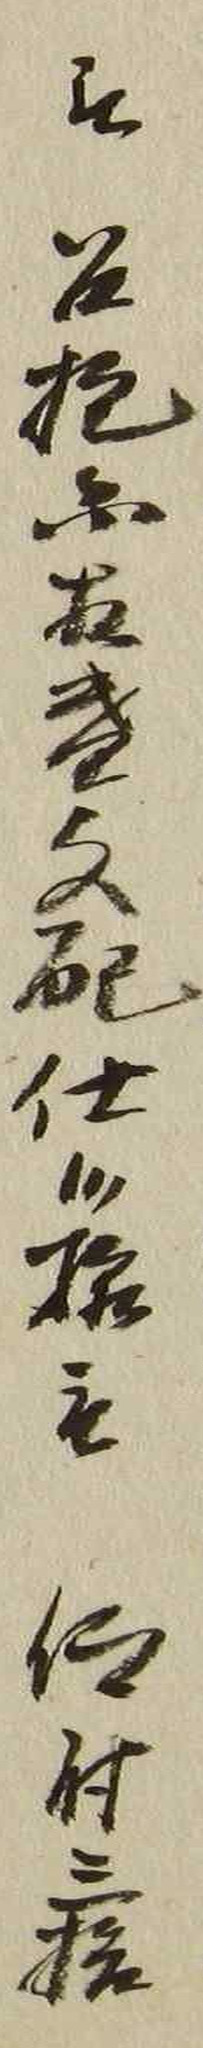被召抱国相遣支配仕候様被仰付三拾
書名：諸士系譜　巻之360　す之部10
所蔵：会津若松市立会津図書館
